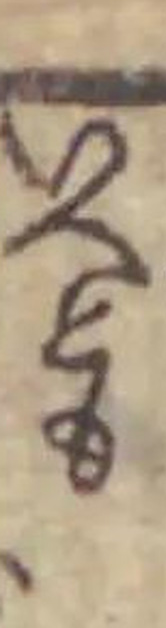いへとも
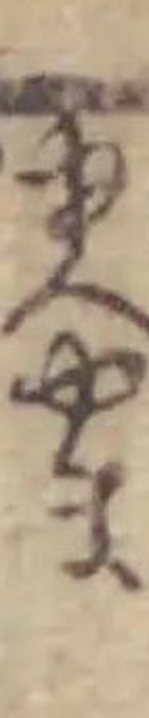ゆへやま
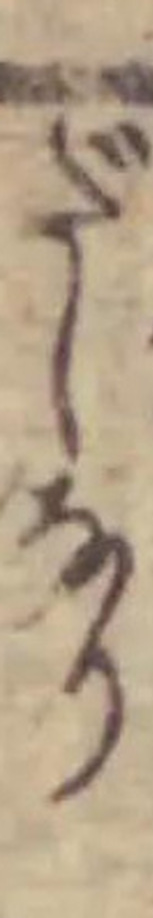だしなり
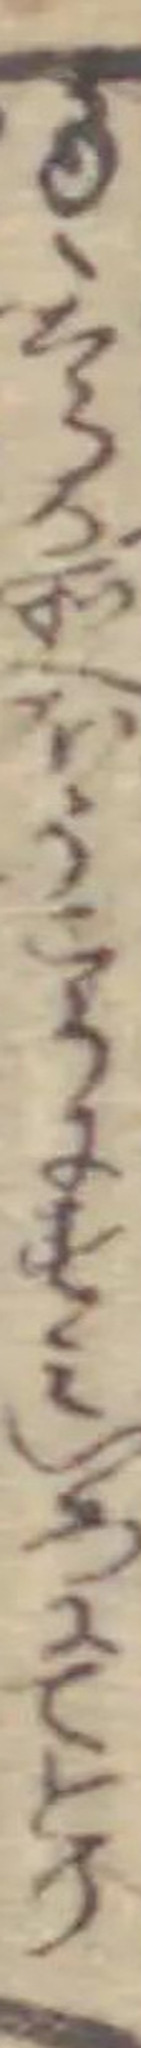もゝ太郎か所へほうこうにすみいろにてとり
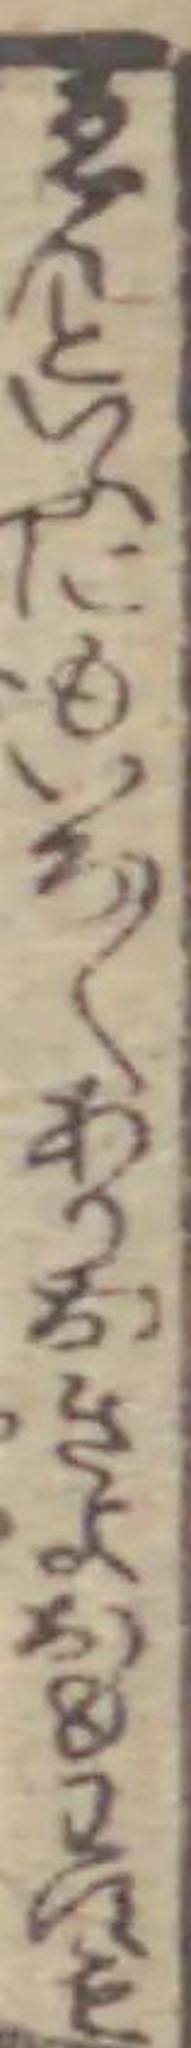ゑんといふにもいろ〳〵ありおきよおもわすも
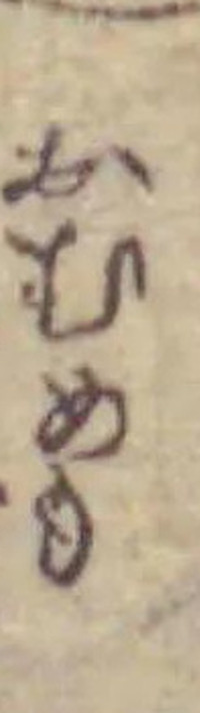おむめも
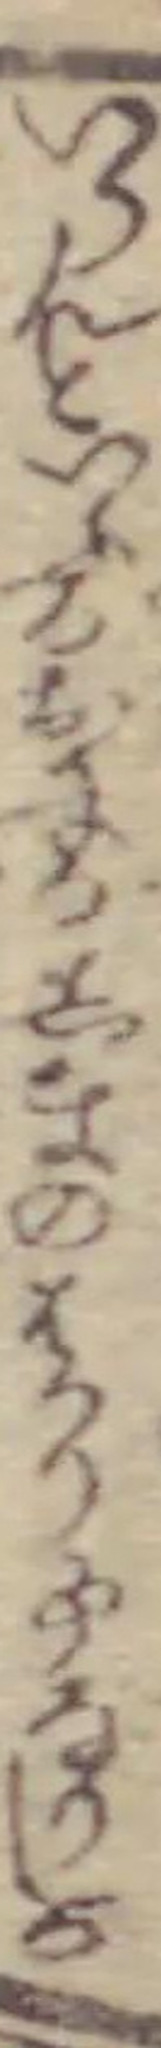いらんといふかおにかしまのはかり事なりしか
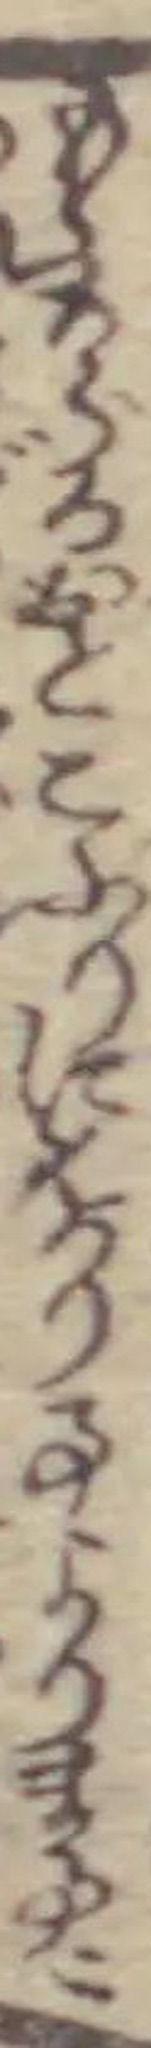もゝ太郎かおとこふりにはかり事よりま事に
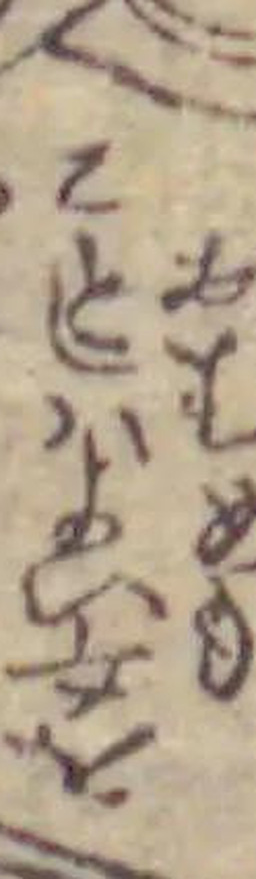ことしはよい女を
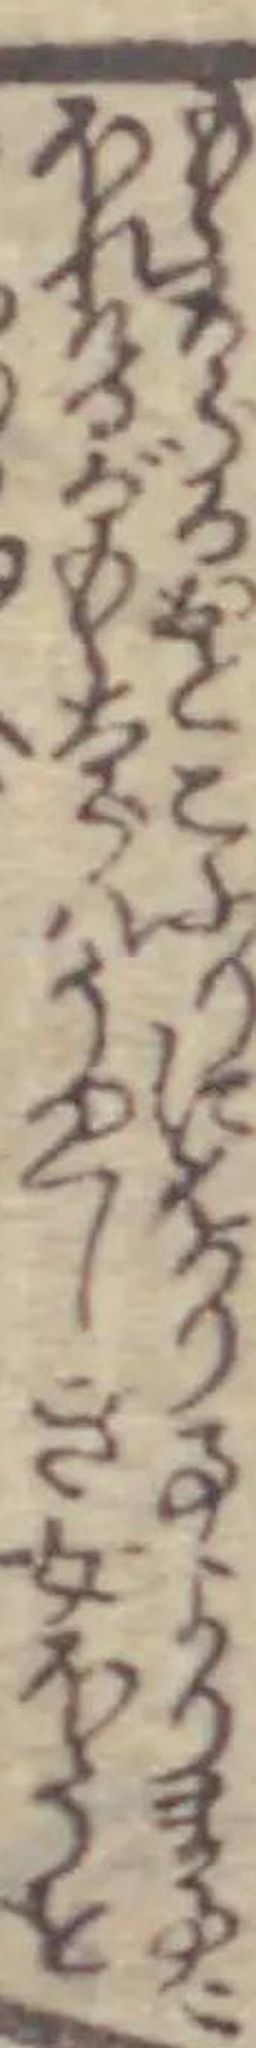ほれけるがもゝ太郎はうつくしき女ほうを
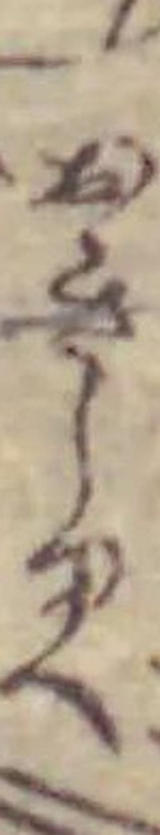おきしゆへ
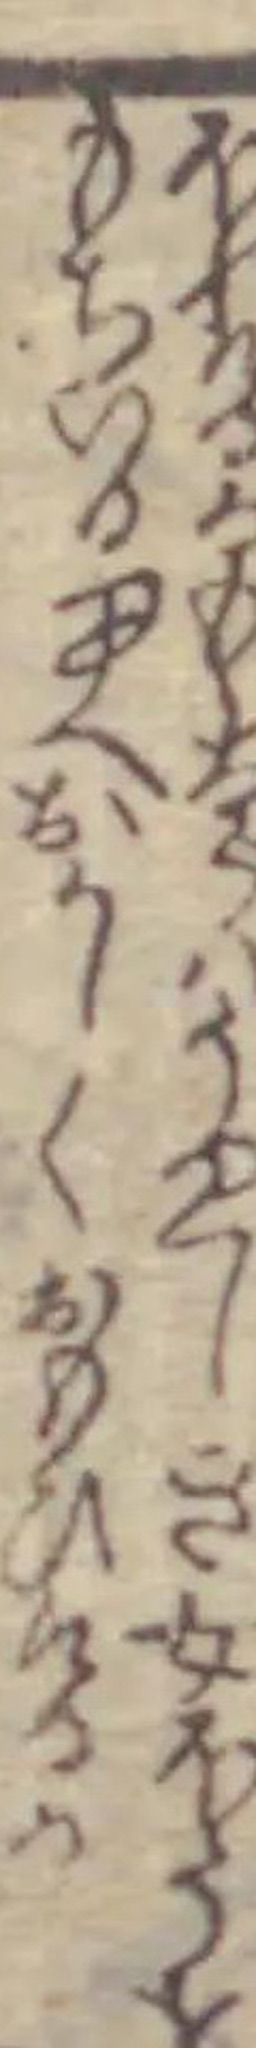もちいるゆへおかしくおもひけるは
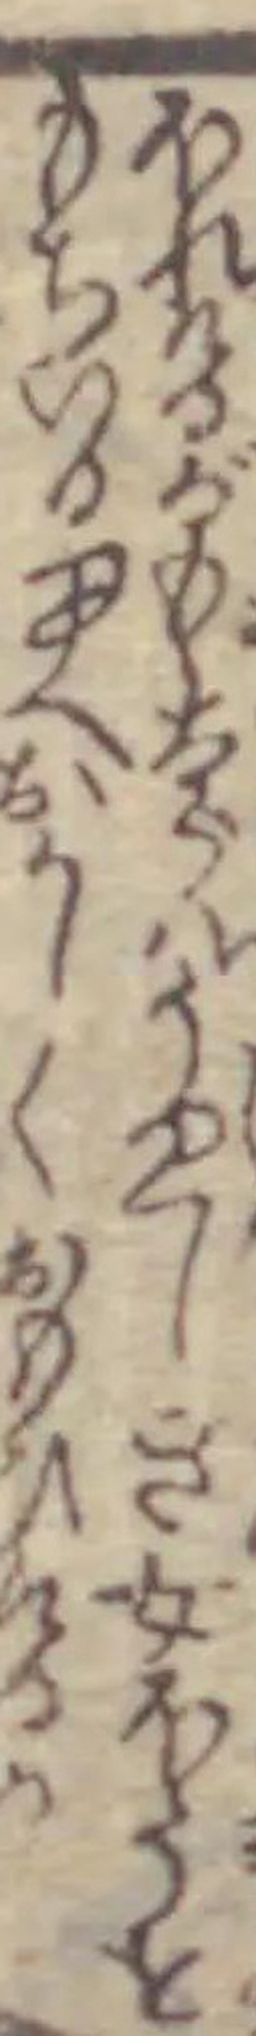もちいるゆへおかしくおもひけるは
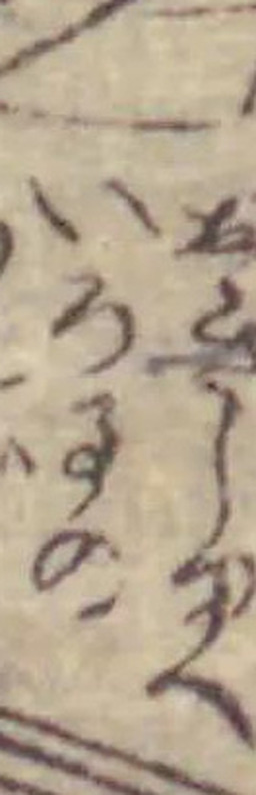いろ事の
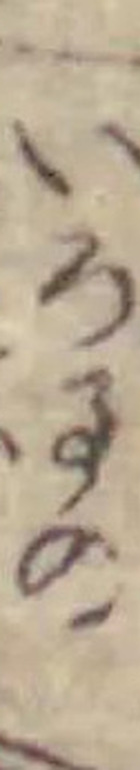いろ事の
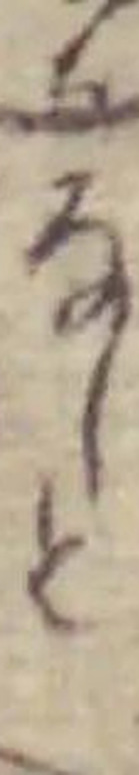なしと
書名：桃太郎元服姿 2巻
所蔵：国立国会図書館 National Diet Library, JAPAN
